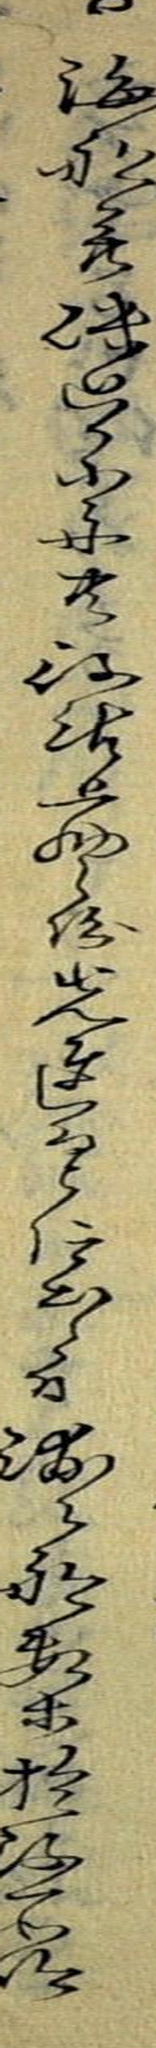○海船并磯廻り小舟共役銀上納之儀先達而被仰出候に付浦々船数等於役所吟
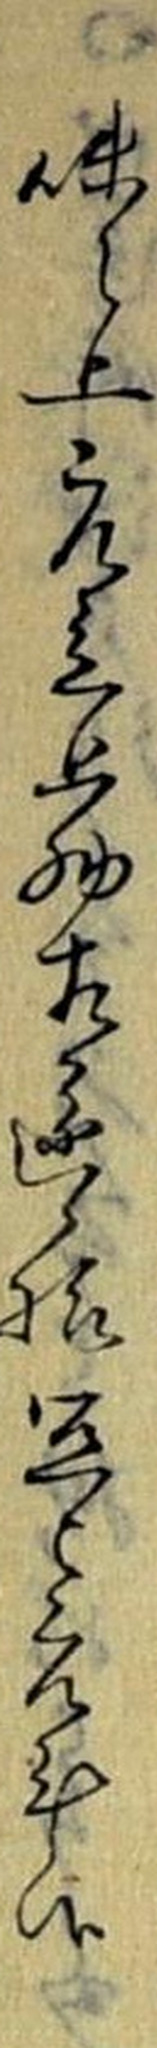味之上取立上納相遂候様宜被取斗候
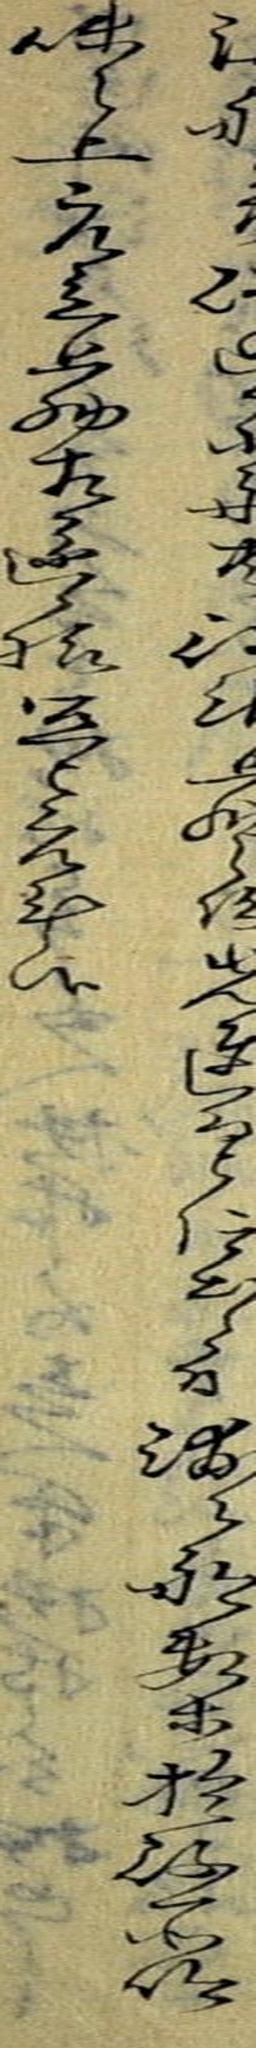味之上取立上納相遂候様宜被取斗候
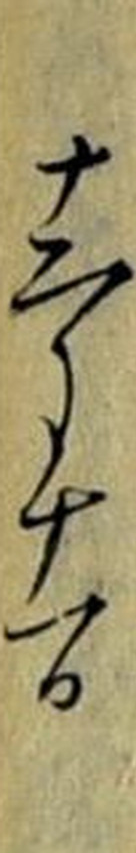十二月十一日
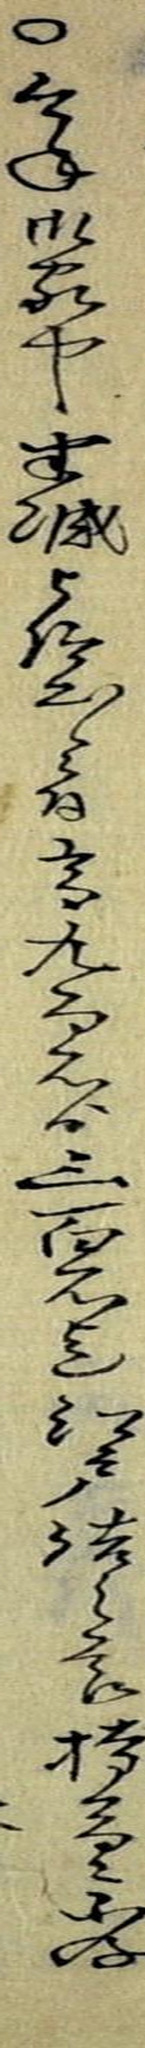○今年御家中半減被仰出候に付高九百石ゟ三百石迄江戸詰之節袴着に不及
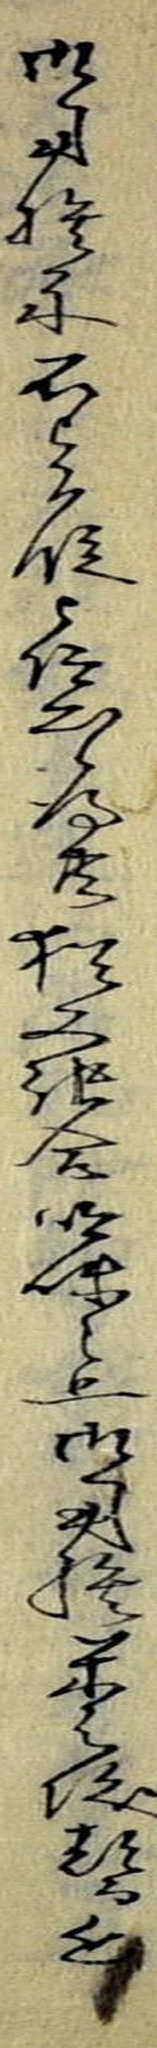御用捨米不被下段被仰出候得共猶又張合吟味之上御用捨米之儀都而近
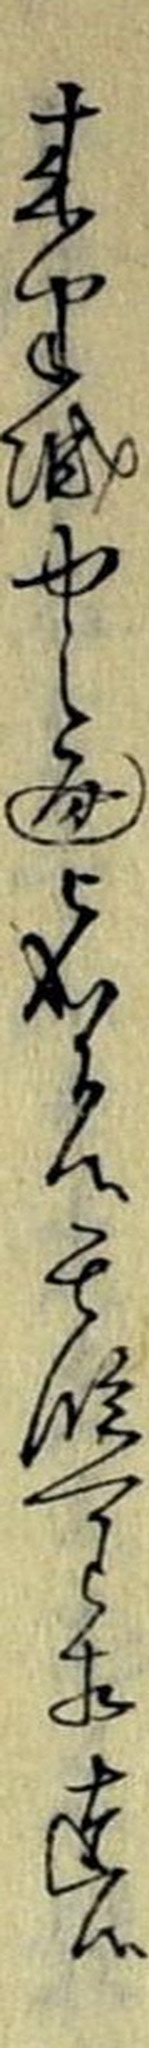来半減中之通被成下候其段可被相達候
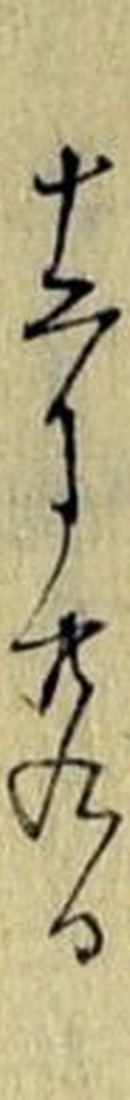十二月廿九日

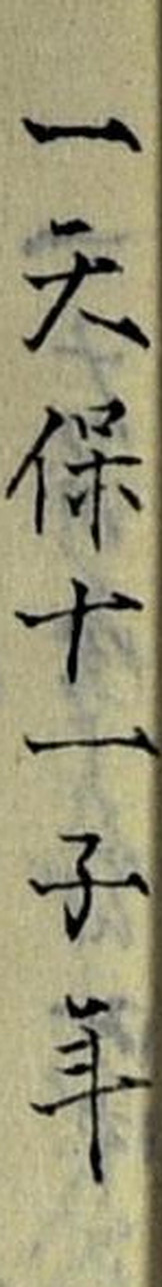一天保十一子年
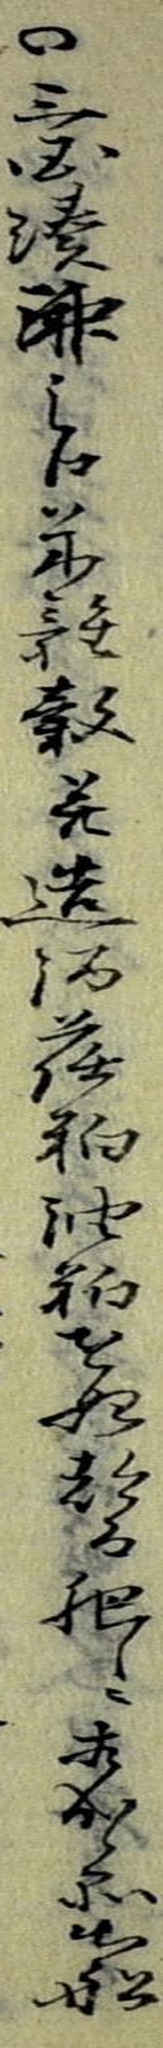○三国湊沖之口米雑穀并造酒荏粕油粕を始都而把に相成候品出船
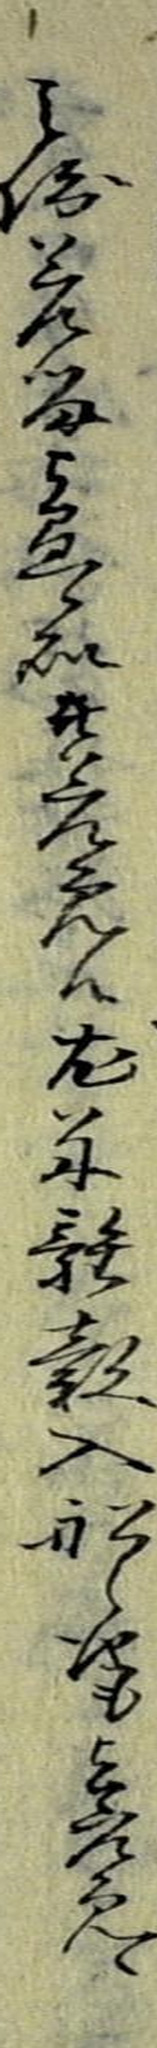之儀差留被置候処被差免候尤米雑穀入船之儀も被差免候
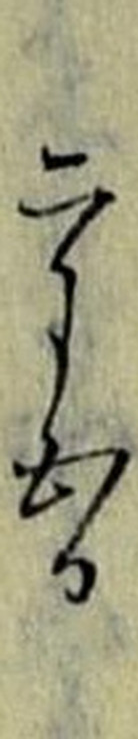二月五日
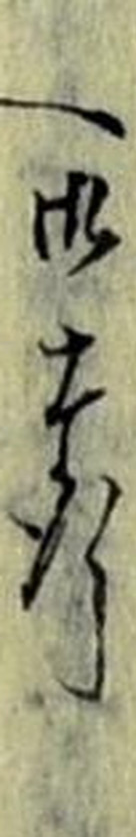御奉行
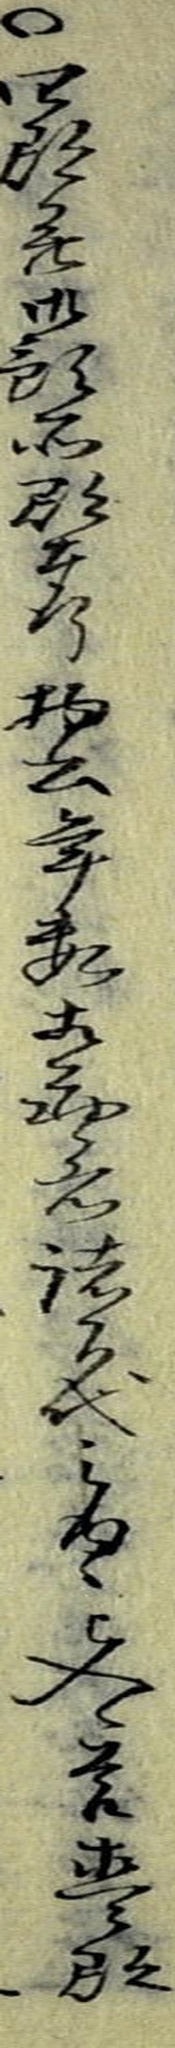○四郡并御預所郡奉行所物書年数相勤候者下代之内へ入候節直々郡
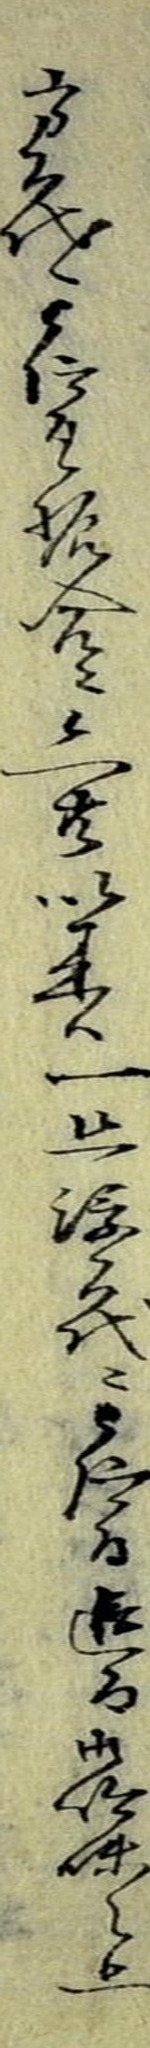方下代へ被仰付候振合に候へ共以来は一旦浮下代に被仰付追而御吟味之上
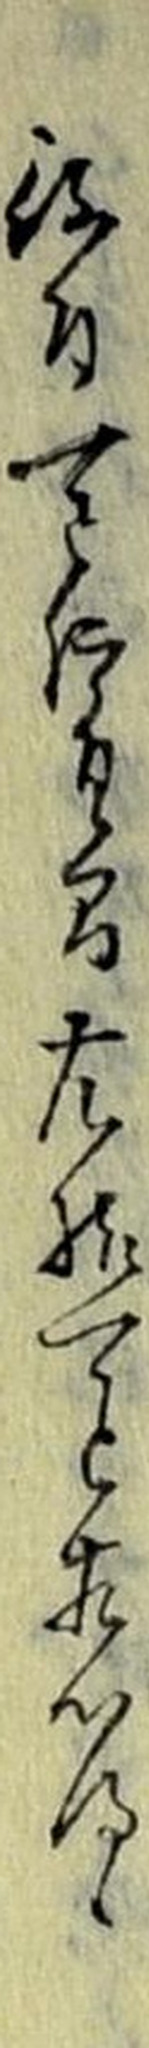役付可被仰付候間左様可被相心得候
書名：命令之部 六
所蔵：福井県文書館 Fukui Prefectural Archives
